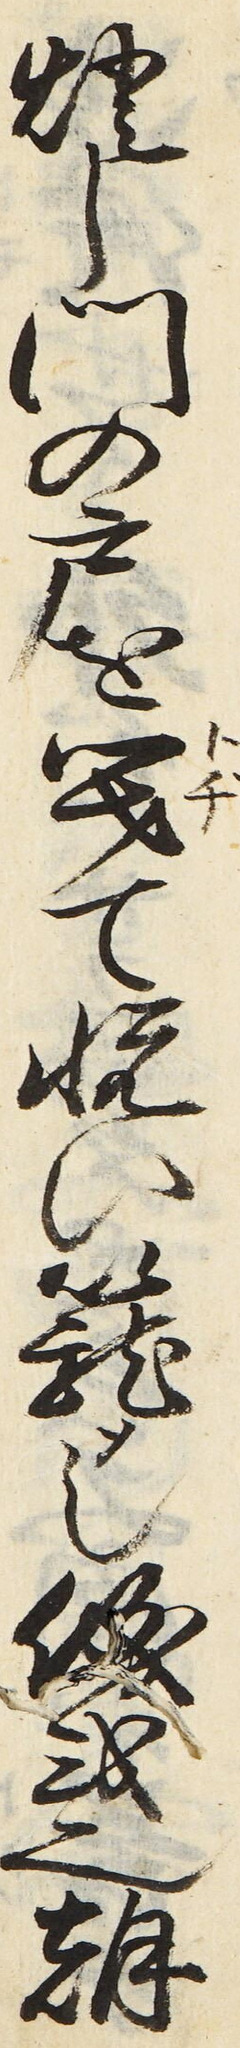燈し門の戸を閉て祝ひ籠メし儀式也朝
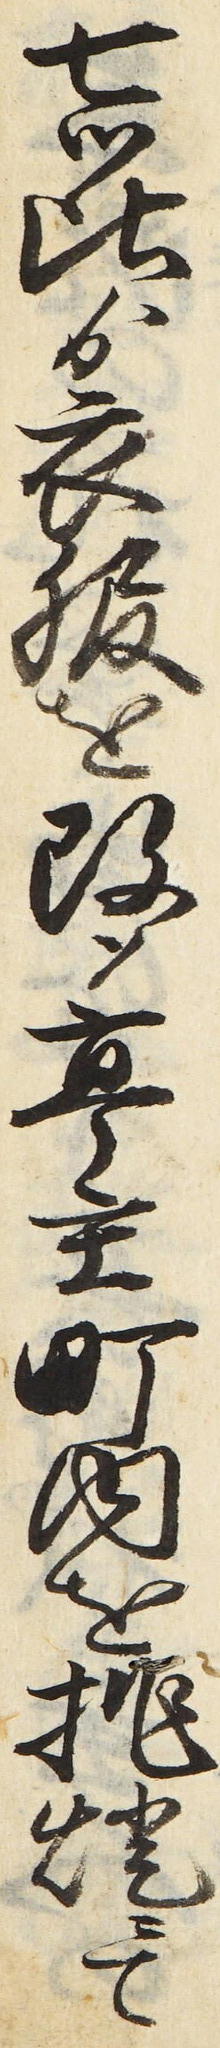七ツ頃ゟ衣服を改め亭主町内を挑燈にて

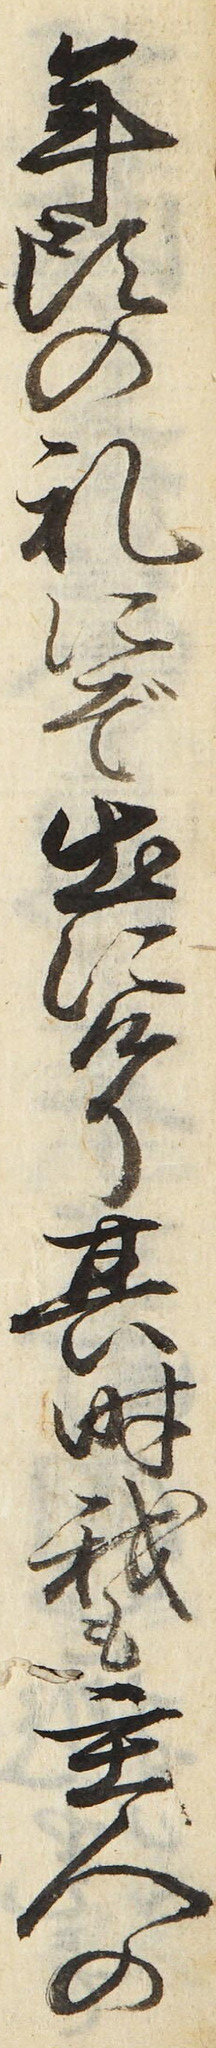年頭の礼にぞ出にけり其時我も主人の
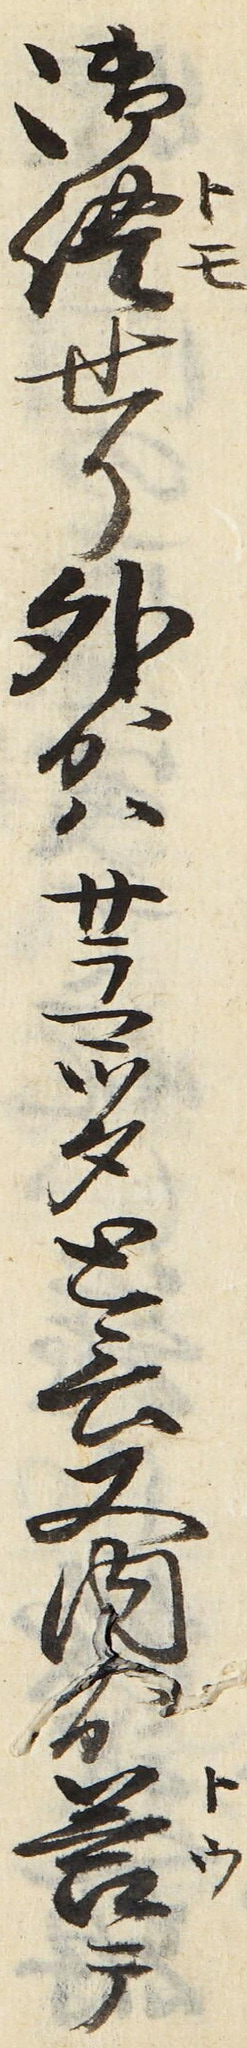御供せり外ゟはサラマツタと云又内ゟ答て
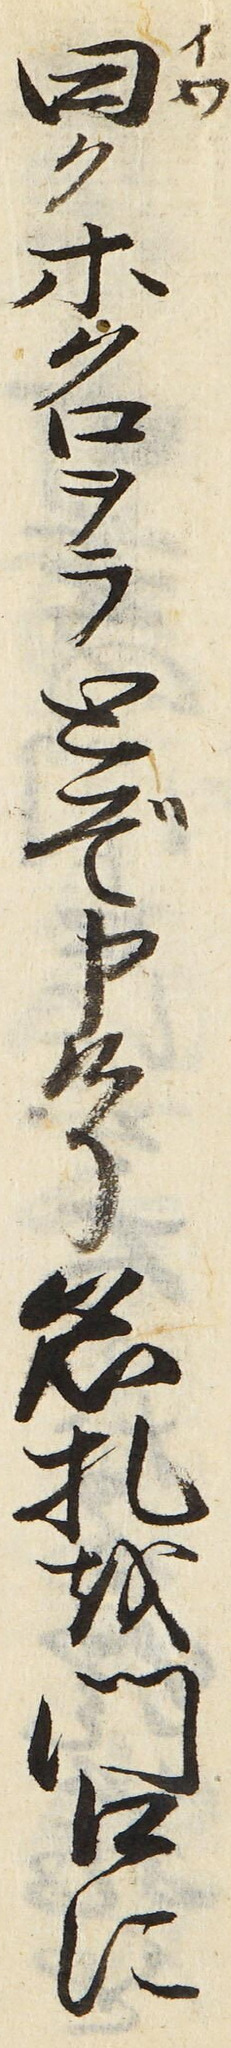曰くホクロヲラとぞ申けり名札を門口に
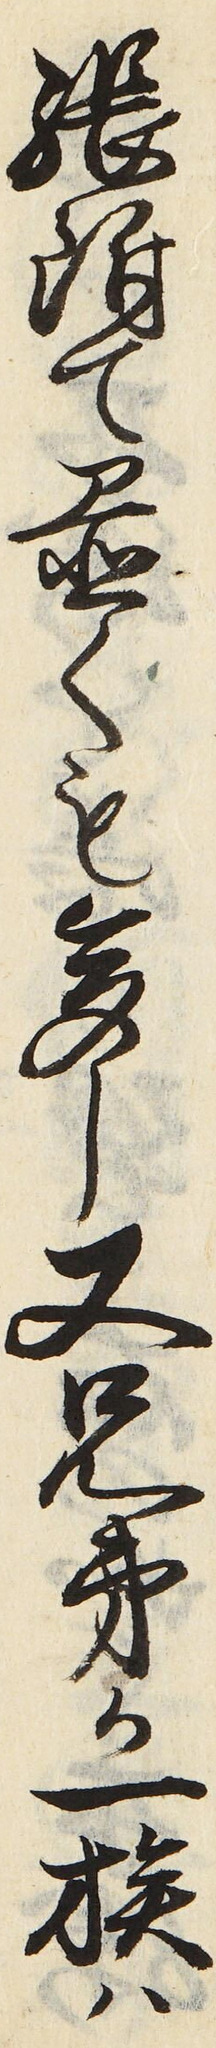張附て置くも多し又兄弟か一族は
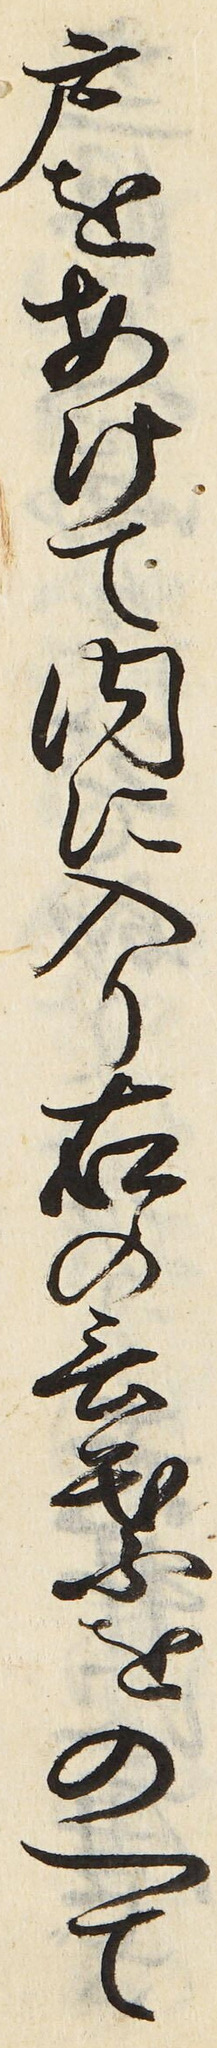戸をあけて内に入り右の云葉をのへて
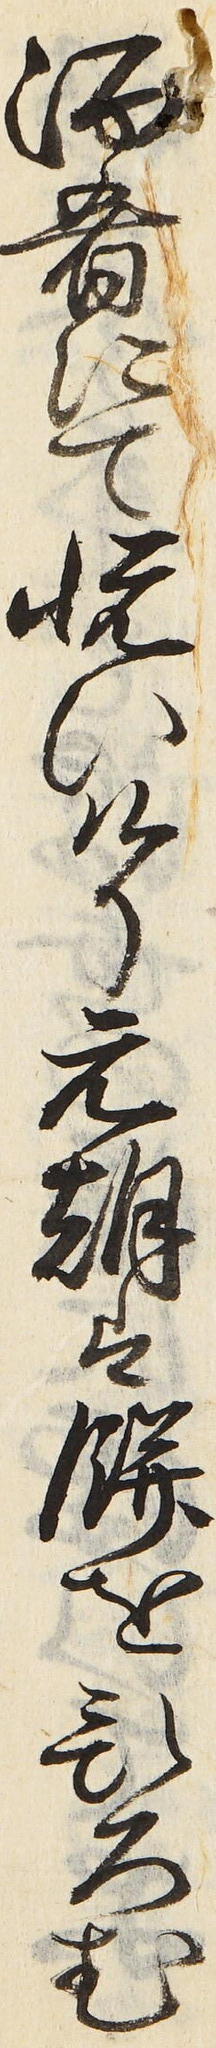酒肴にて祝ひけり元朝は餅をひろむ
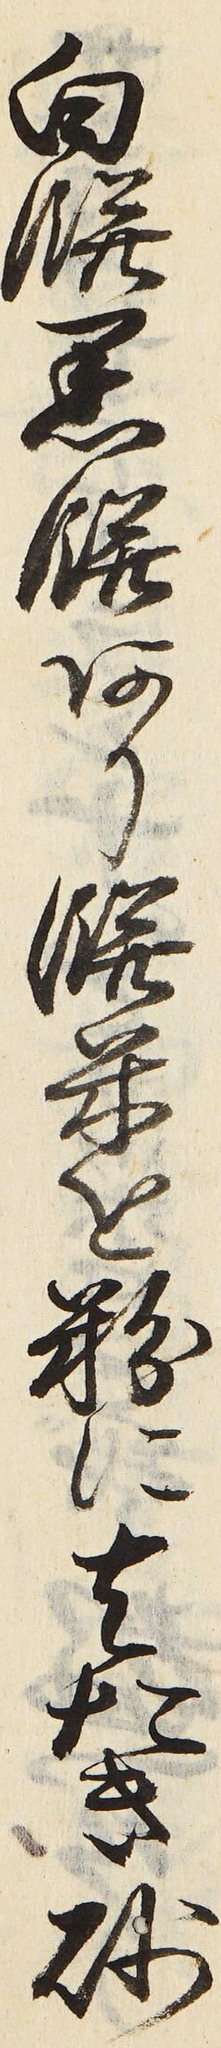白餅黒餅あり餅米を粉にはたき砂
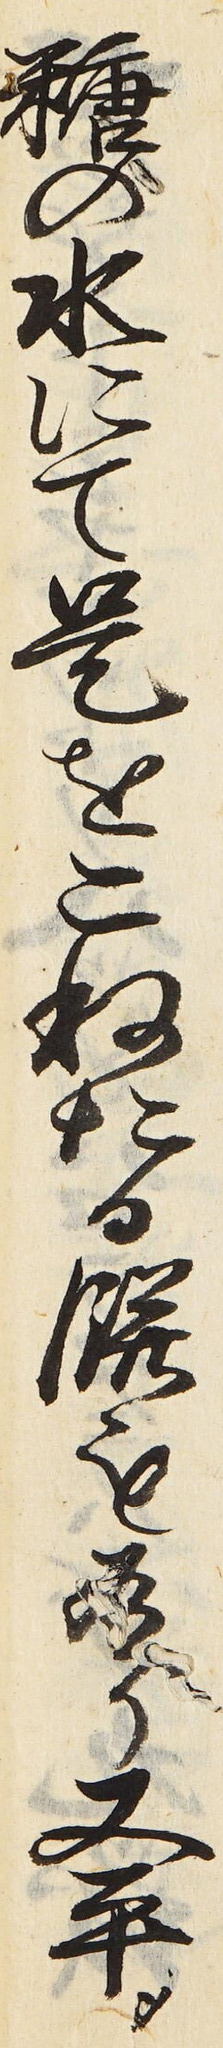糖の水にて是をこねたる餅も有り又平〆
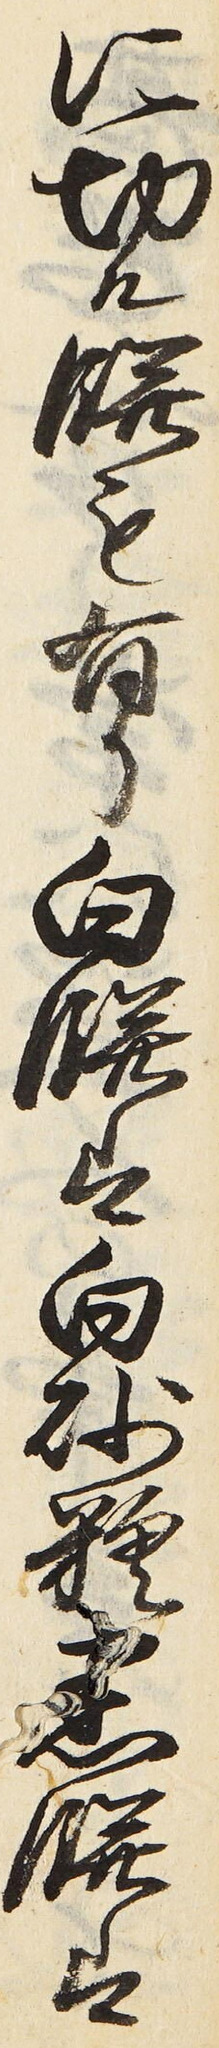に切る餅も有り白餅は白砂糖黒餅は
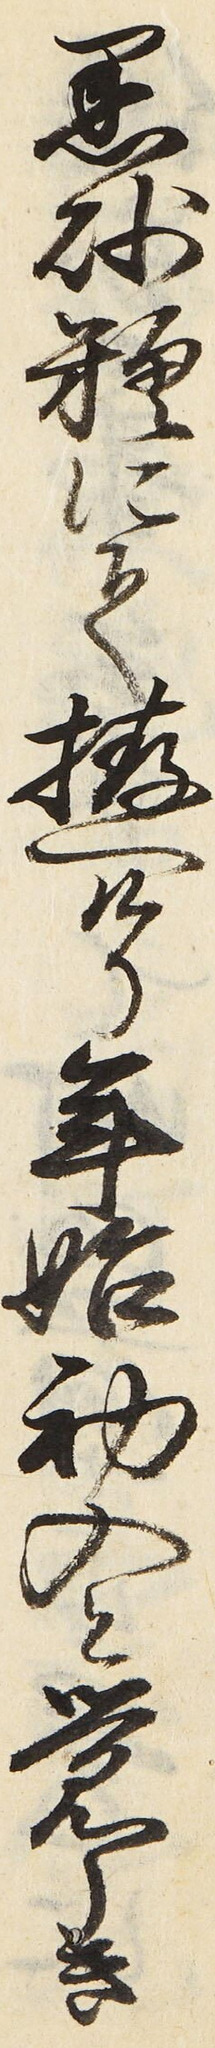黒砂糖にて拵へけり年始初入と覚しき
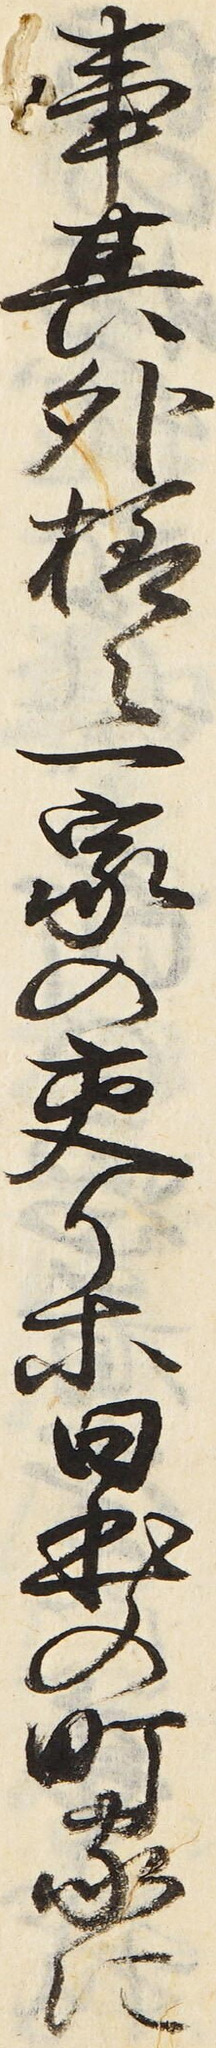事其外様々一家の交り等日本の町家に
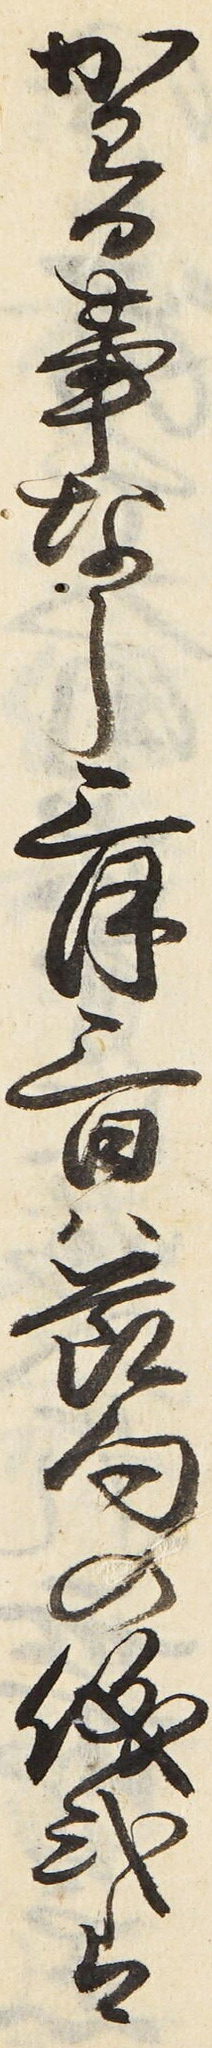かわる事なし三月三日は節句の儀式は
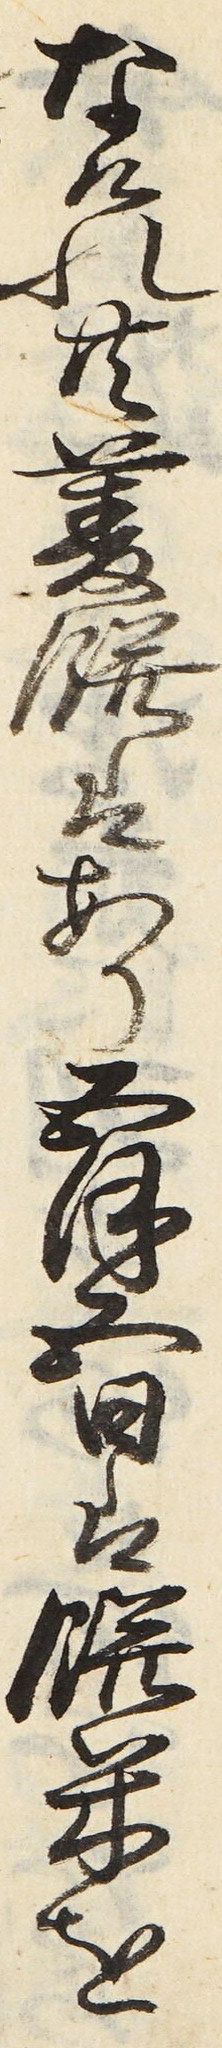なけれ共菱餅はあり五月五日は餅米を
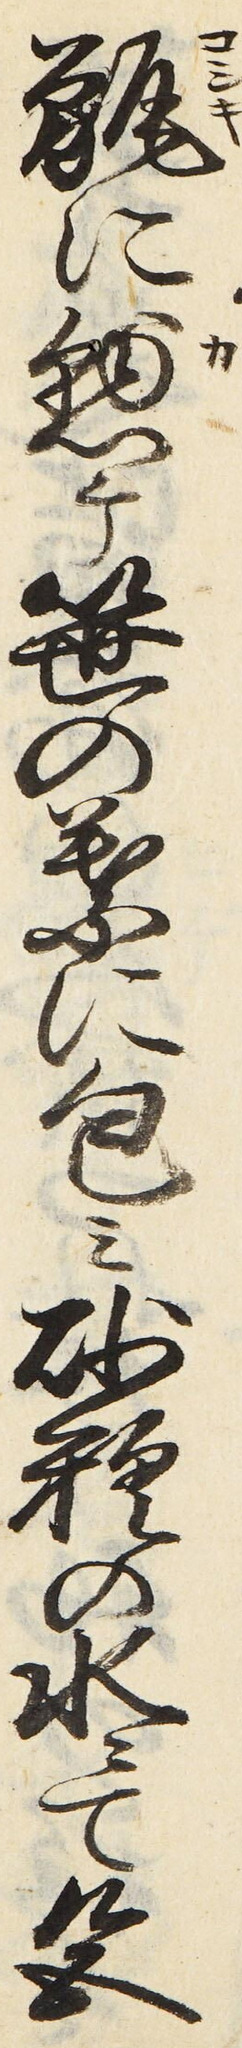甑に懸け笹の葉に包み砂糖の水にて色
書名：華夷九年録
